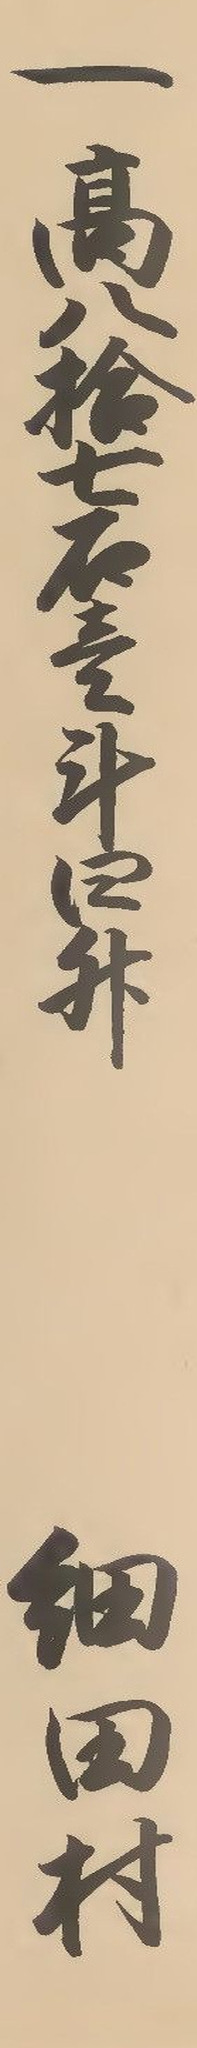一高八拾七石壱斗四升細田村
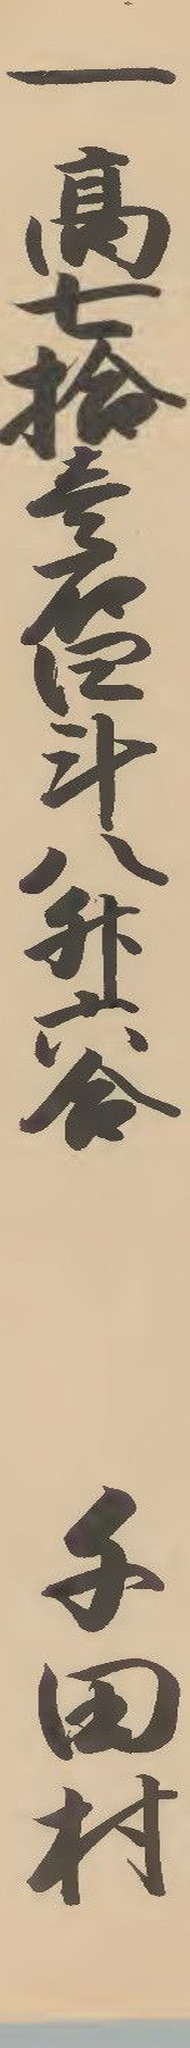一高七拾壱石四斗八升六合千田村
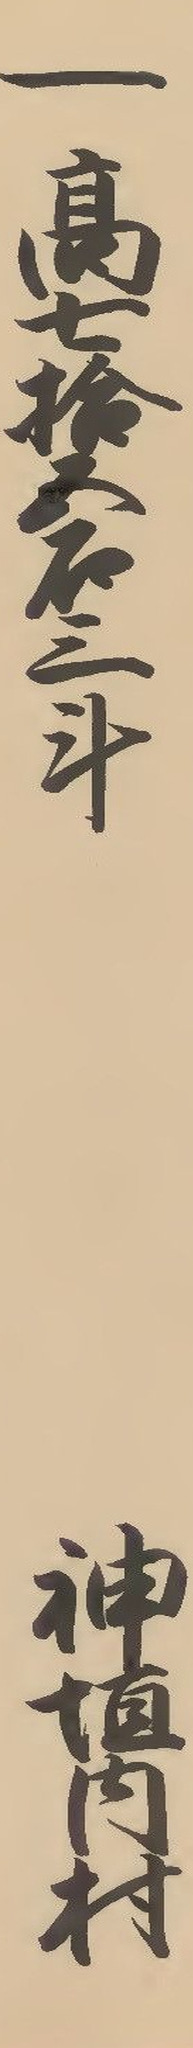一高七拾五石三斗神垣内村

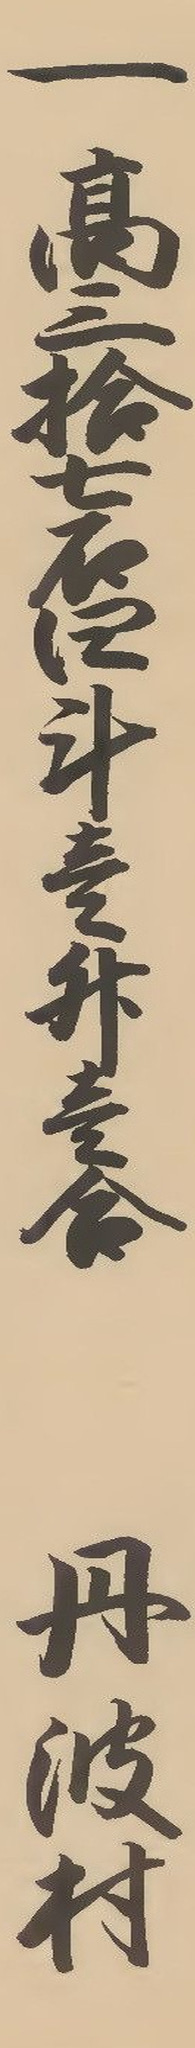一高三拾七石四斗壱升壱合丹波村
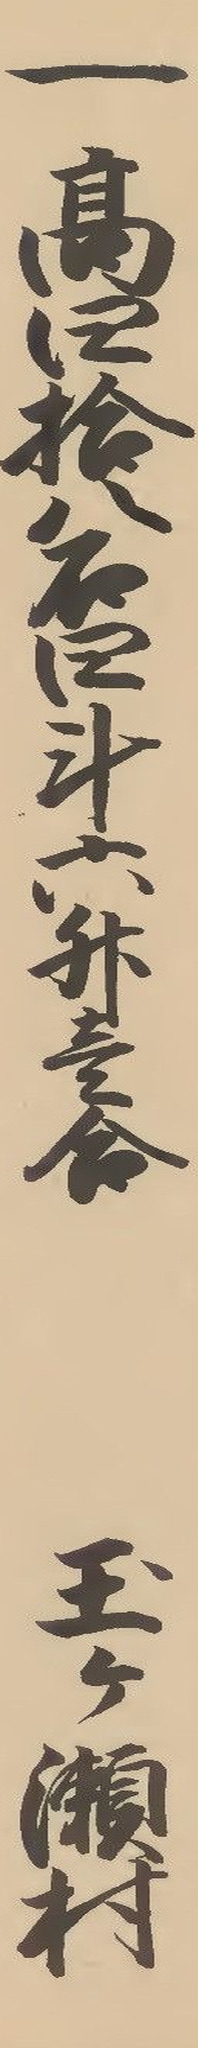一高四拾八石四斗六升壱合玉ヶ瀬村
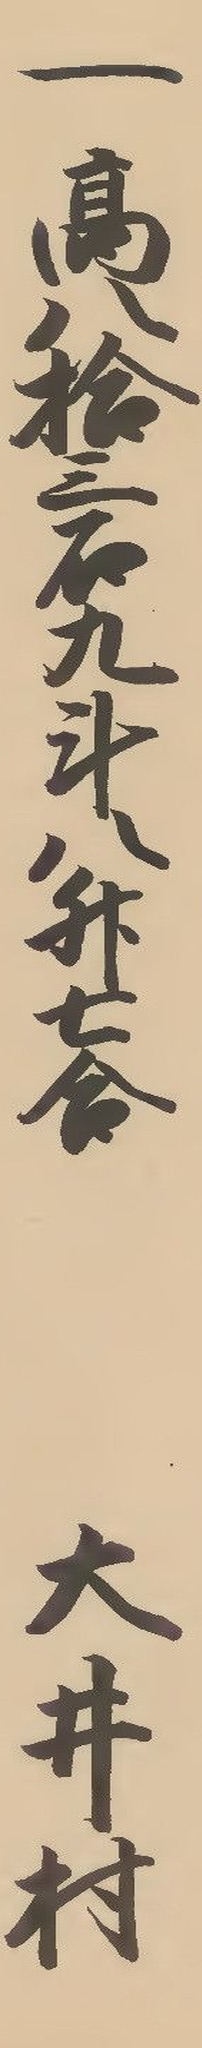一高八拾三石九斗八升七合大井村
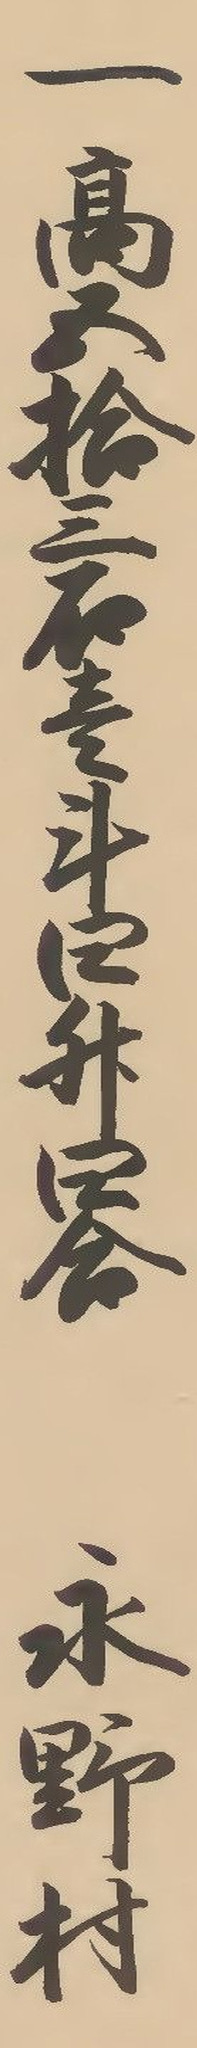一高五拾三石壱斗四升四合永野村
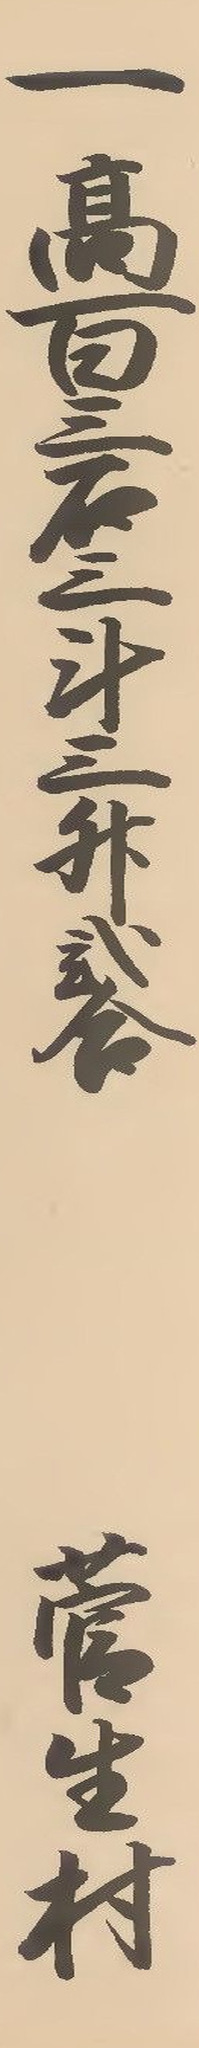一高百三石三斗三升弐合菅生村
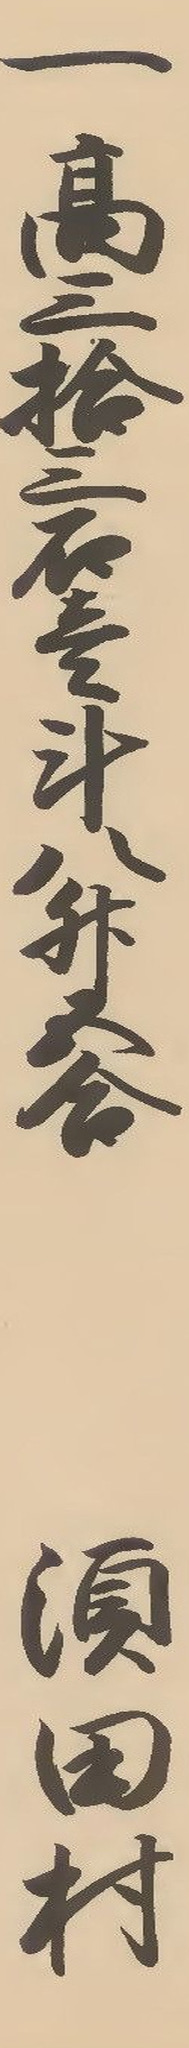一高三拾三石壱斗八升五合須田村
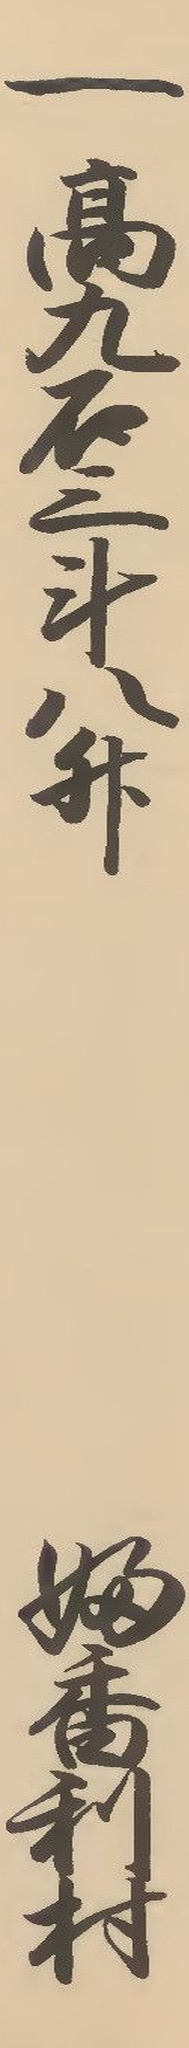一高九石三斗八升婦香利村
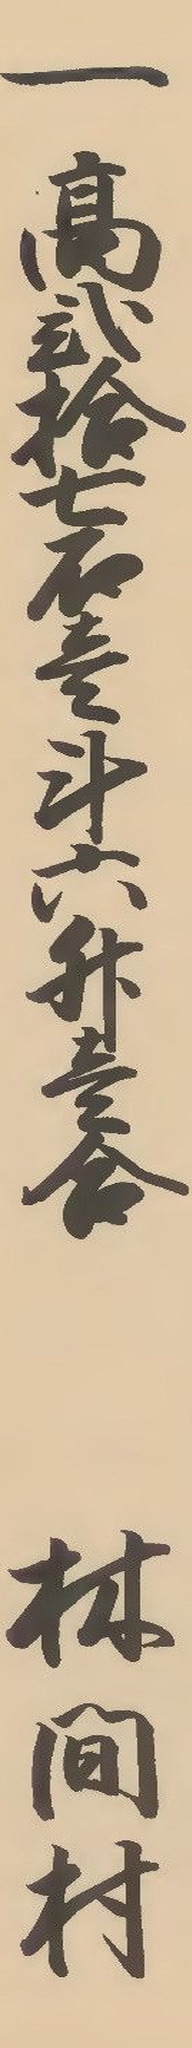一高弐拾七石壱斗六升壱合林間村

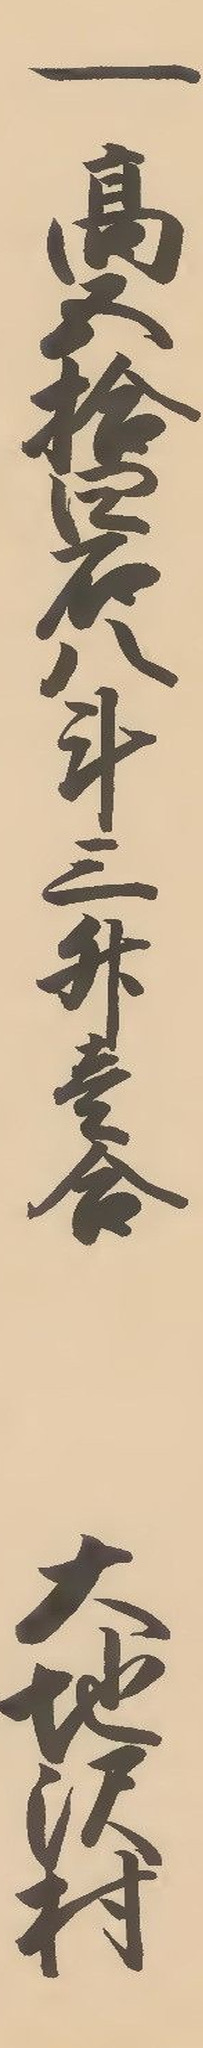一高五拾四石八斗三升壱合大地沢村
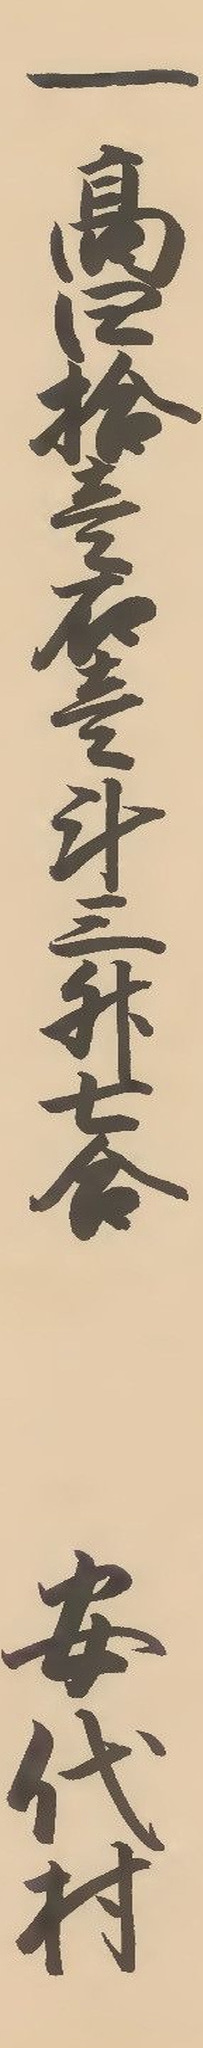一高四拾壱石壱斗三升七合安代村
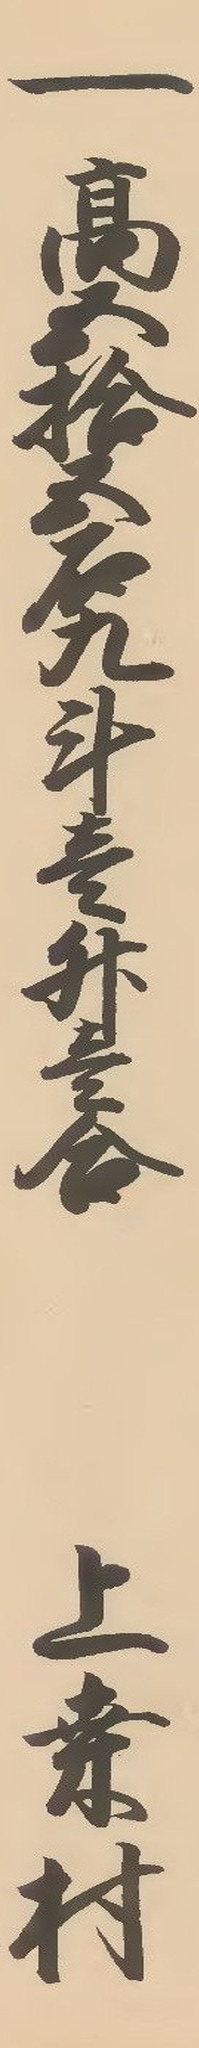一高五拾五石九斗壱升壱合上桑村
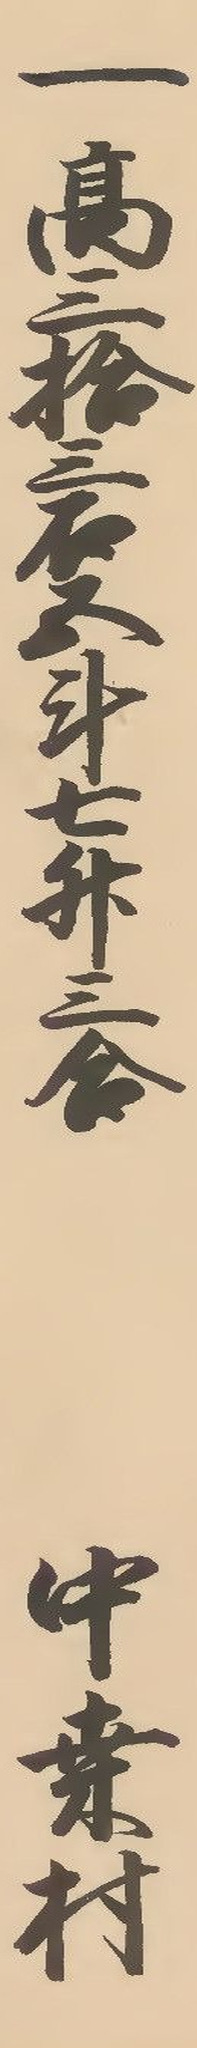一高三拾三石五斗七升三合中桑村
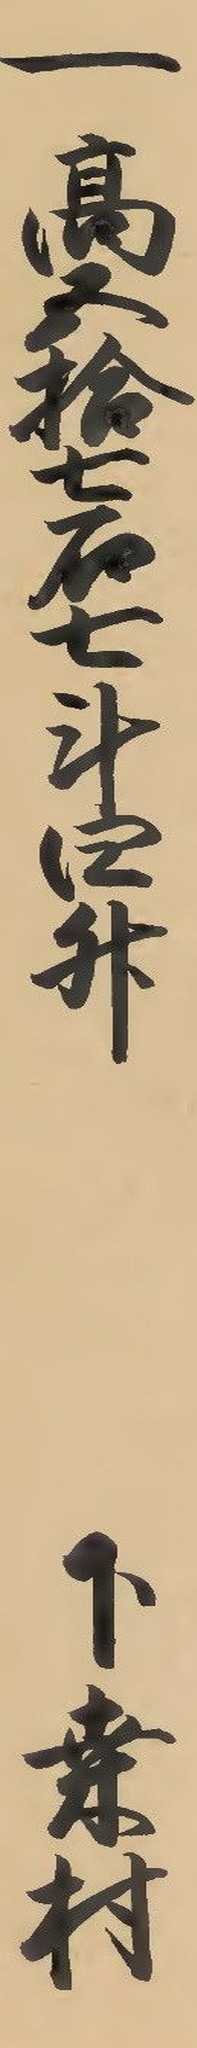一高五拾七石七斗四升下桑村
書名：三河国郷帳
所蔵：国立公文書館 National Archives of Japan
